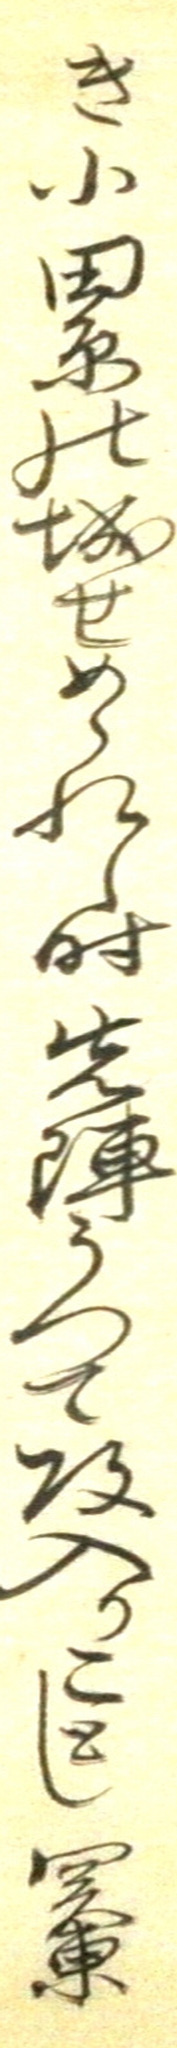き小田原の城せめられし時先陣うつて攻入りことし関東
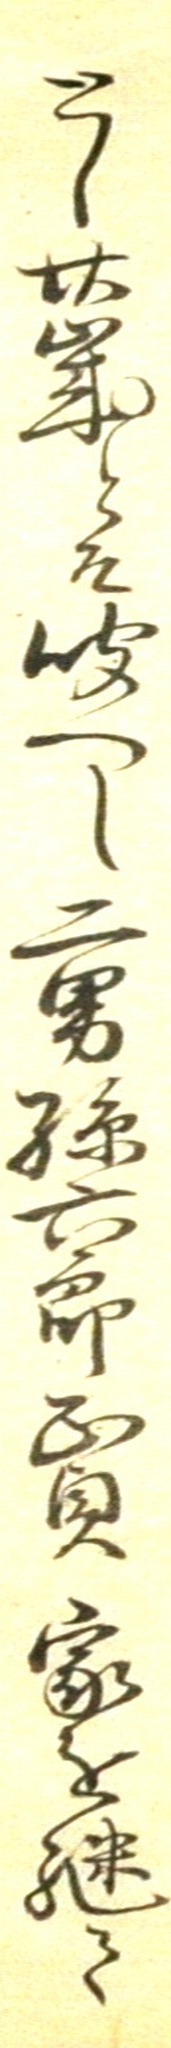とし廿歳とそ聞へし二男孫六郎正貞家を継て
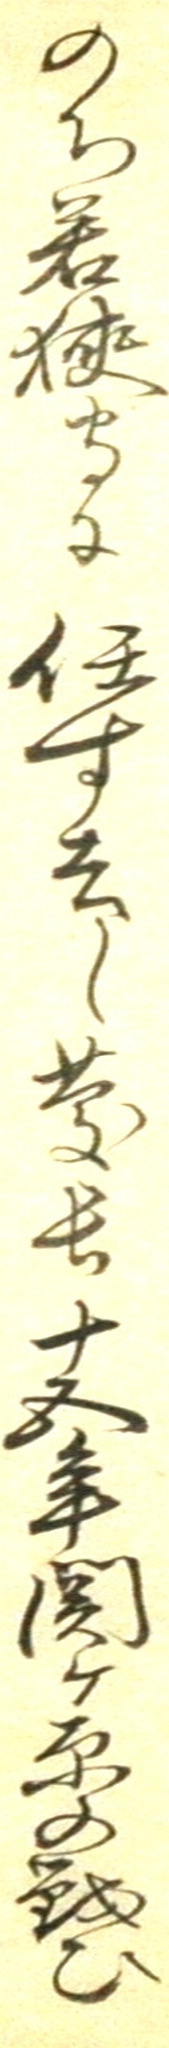のち若狭守に任す去し慶長十五年関ヶ原の戦ひ
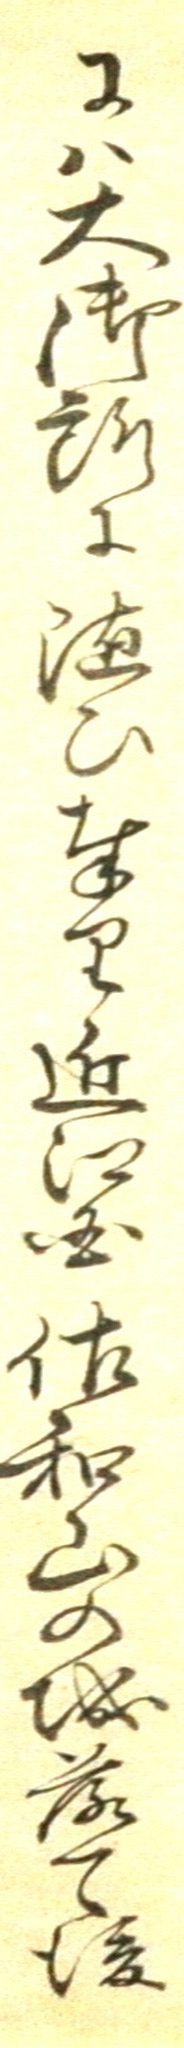には大御所に随ひ奉り近江国佐和山の城落て後
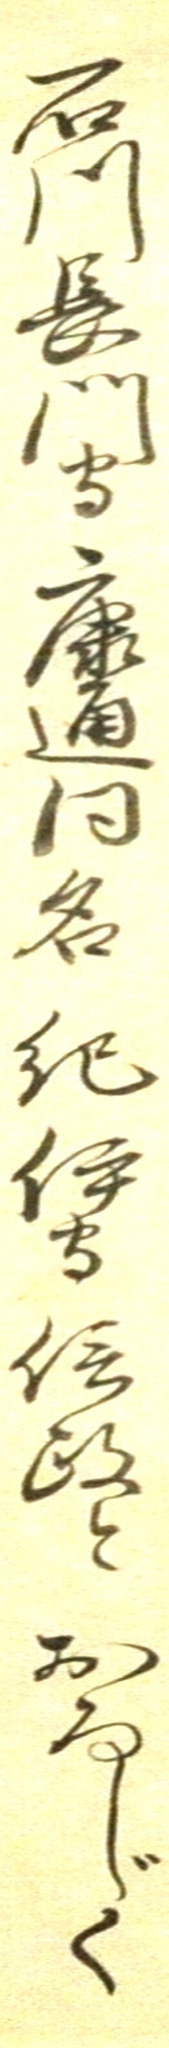石川長門守康通同名紀伊守信政とおなじく
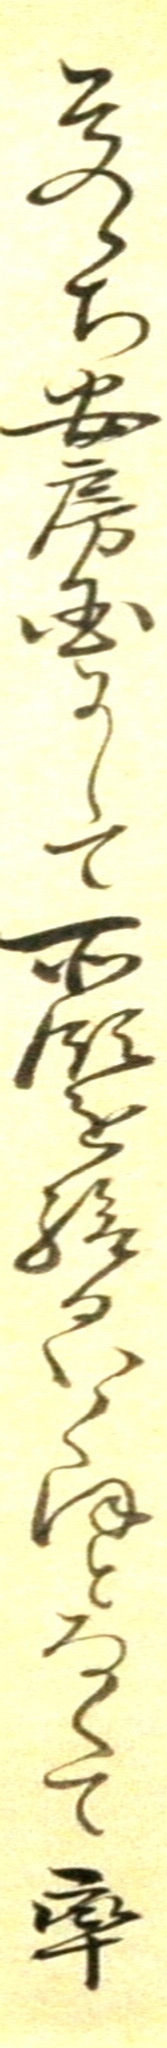そのゝち安房国にして所領を給るいくほとなくて卒

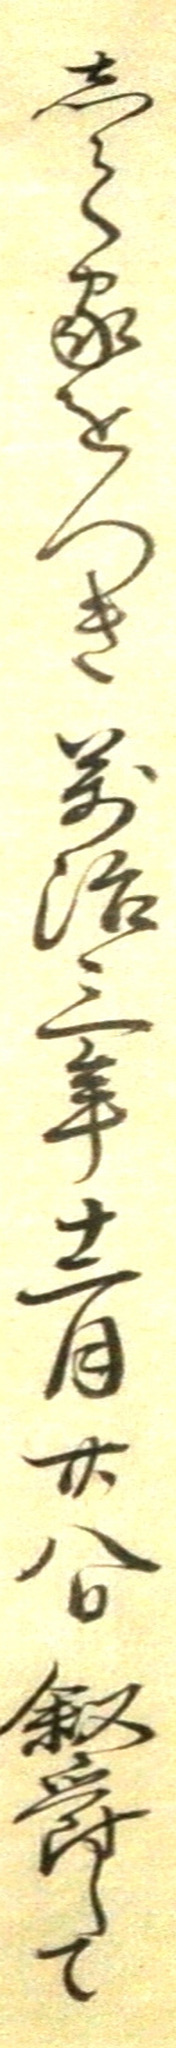して家をつき万治三年十二月廿八日叙爵して
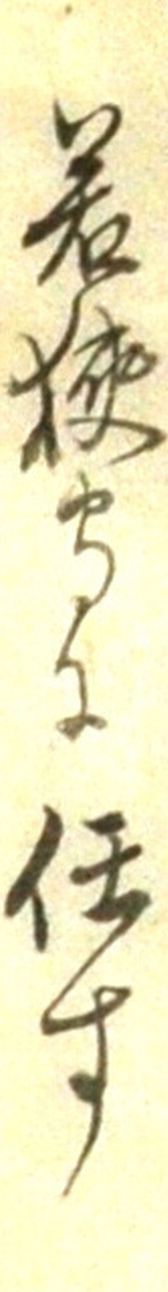若狭守に任す
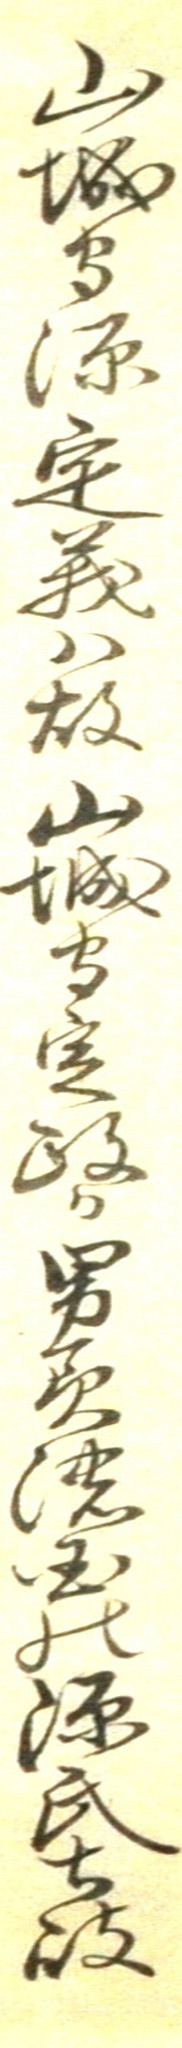山城守源定義は故山城守定政か男美濃国の源氏土岐
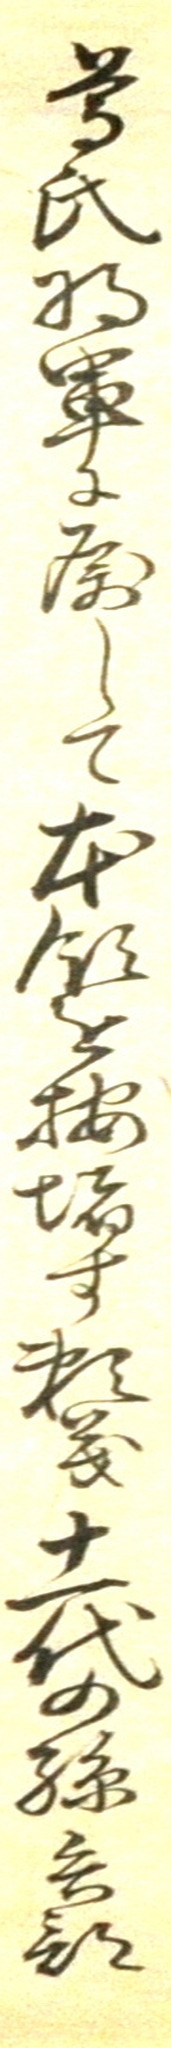尊氏将軍に属して本領を按堵す頼義十一代の孫兵部
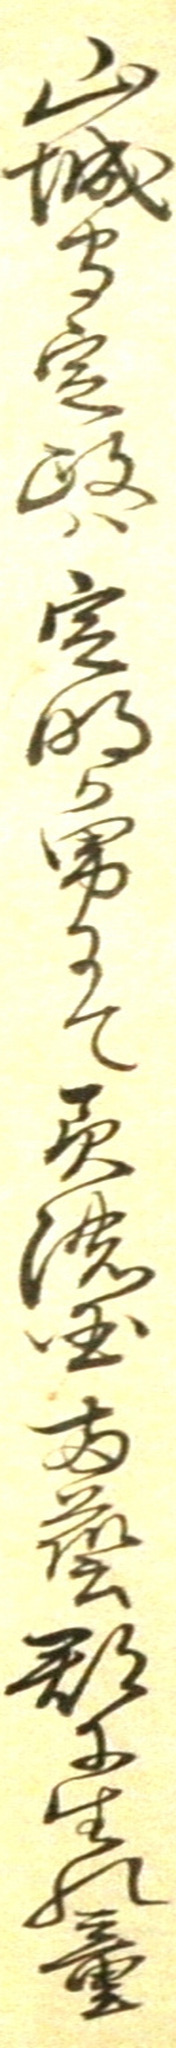山城守定政は定明か男にて美濃国多芸郡に生れ童
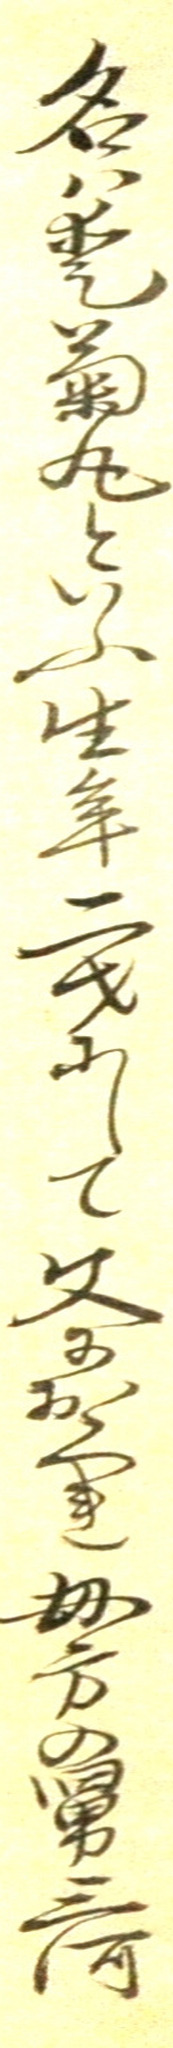名は愛菊丸といふ生年二才にして父におくれ母方の舅三河

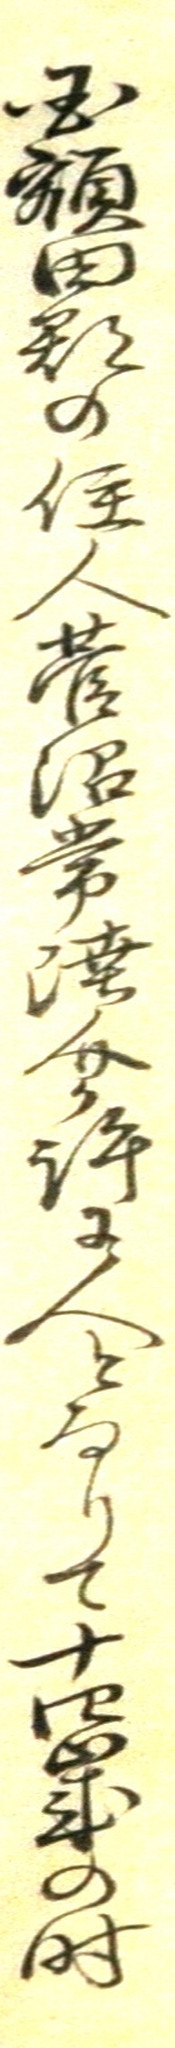国額田郡の住人菅沼常陸介か許に人となりて十四歳の時
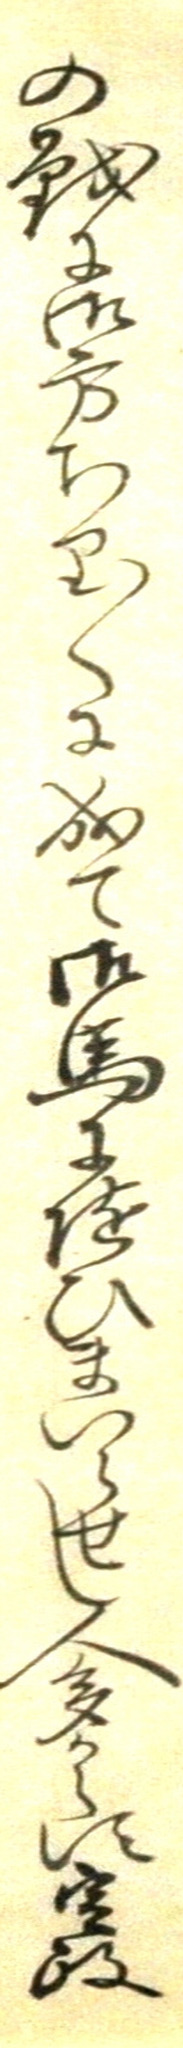の戦に御方ちり〳〵に成て御馬に随ひまいらせし人多からす定政
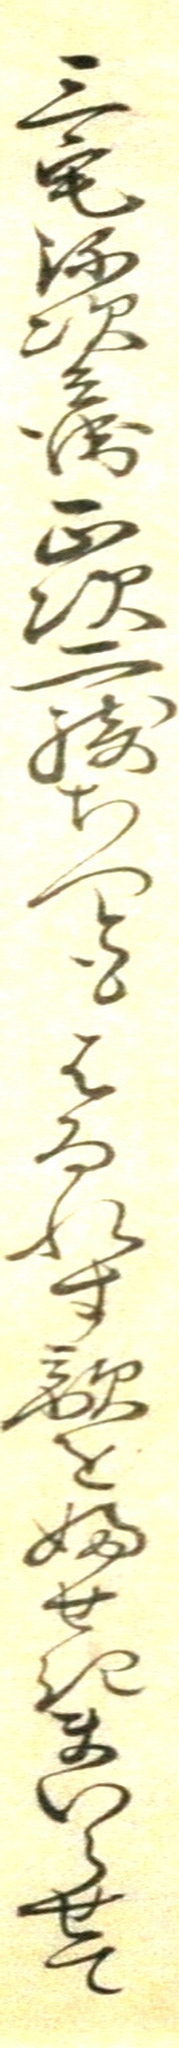三宅弥次兵衛正次二騎ちつともはなれす敵をふせきまいらせて
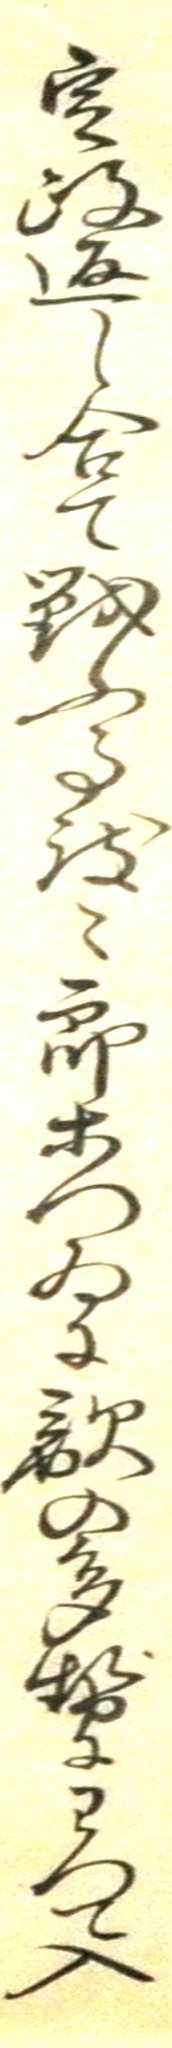定政返し合て戦ふ事度々郎等つゐに敵の多勢にわつて入
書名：藩翰譜（四・下）
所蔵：伊那市立高遠町図書館・合同会社AMANE
